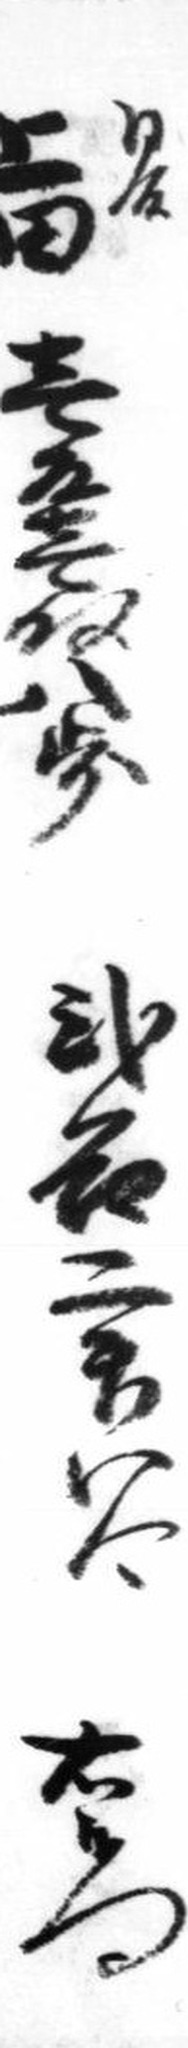上田壱反壱畝八歩弐石二升八合右衛門

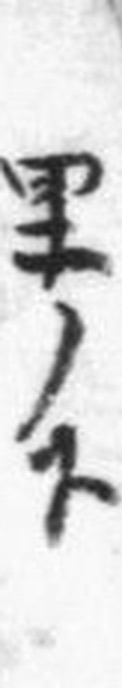里ノ下
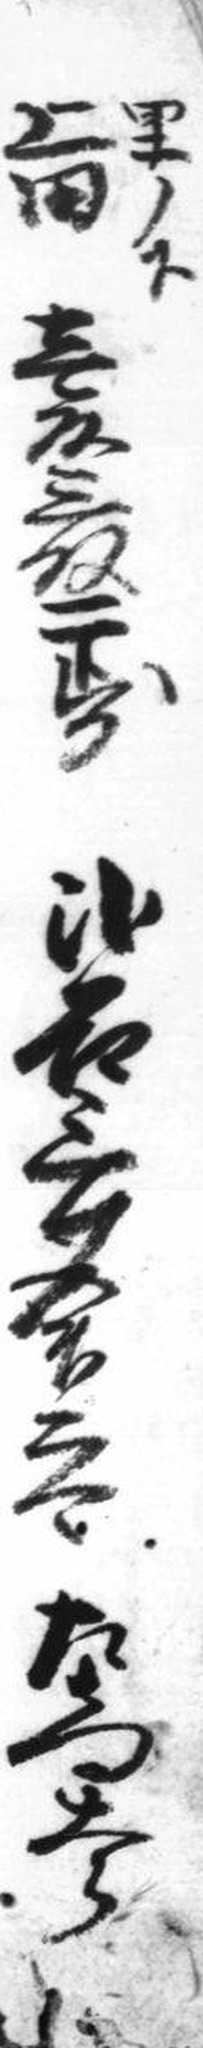上田壱反三畝二歩弐石三斗五升二合左衛門太郎
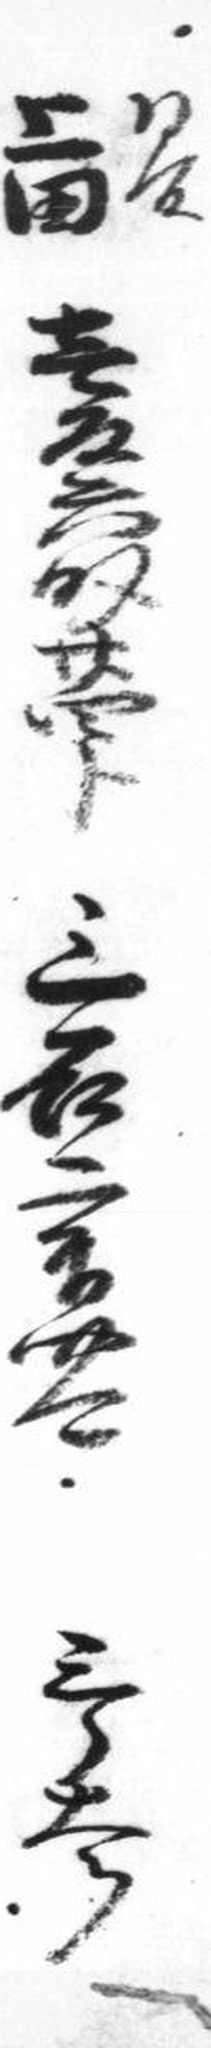上田壱反六畝廿四歩三石二升四合三郎太郎
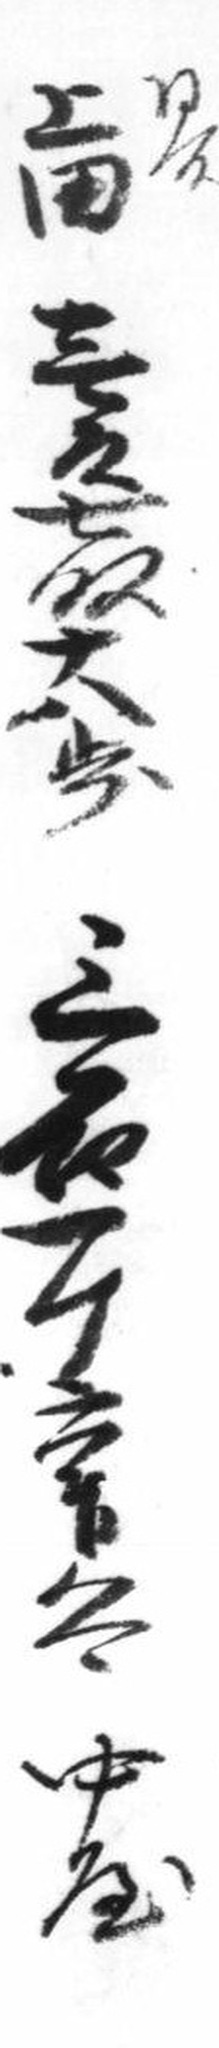上田壱反七畝十八歩三石一斗六升八合中屋
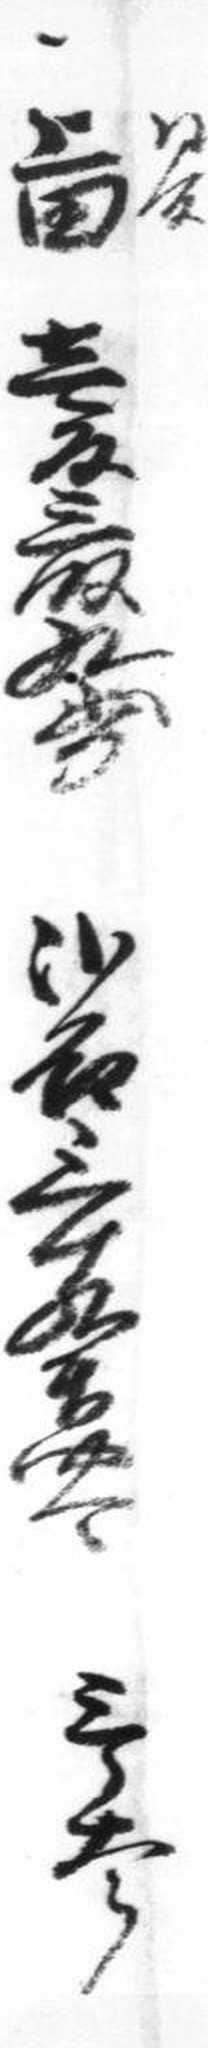上田壱反三畝九歩弐石三斗九升四合三郎太郎
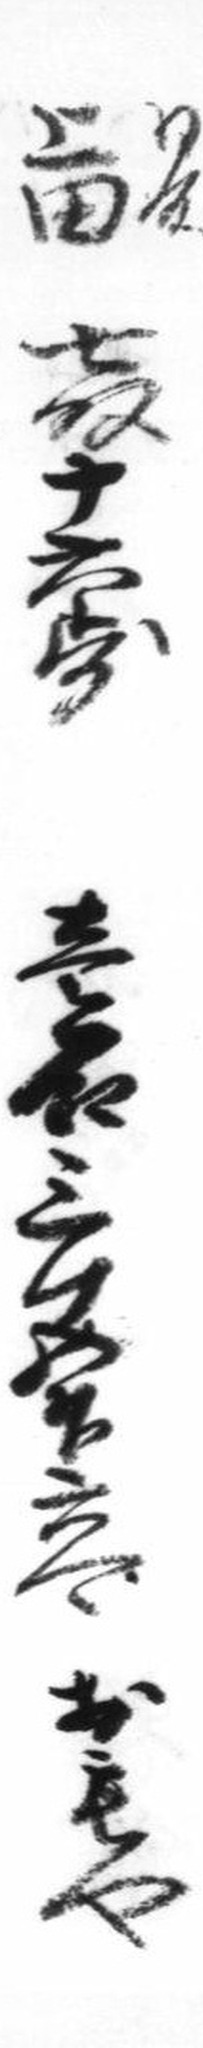上田七畝十六歩壱石三斗五升六合出〆屋
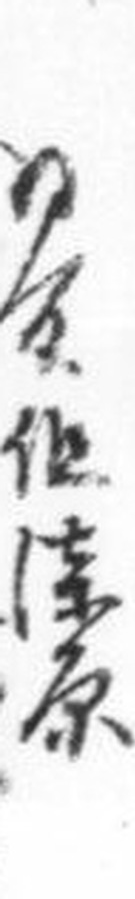同所但漆原
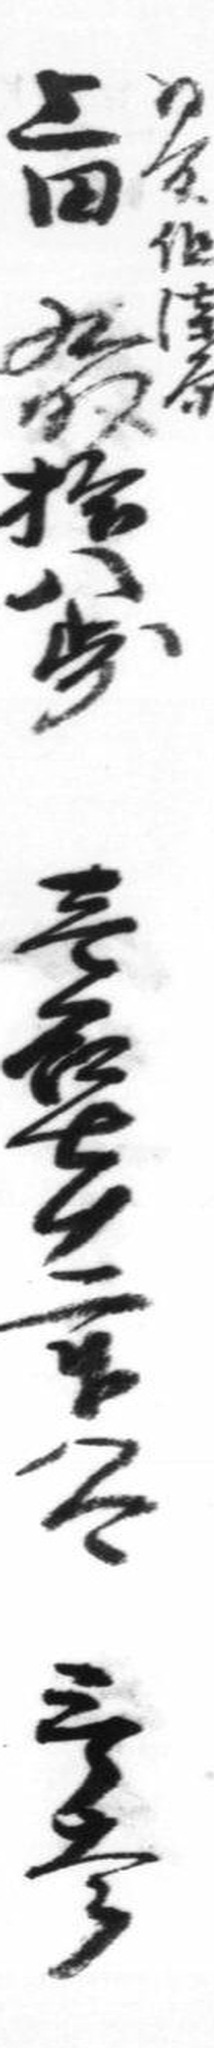上田九畝拾八歩壱石七斗二升八合三郎太郎
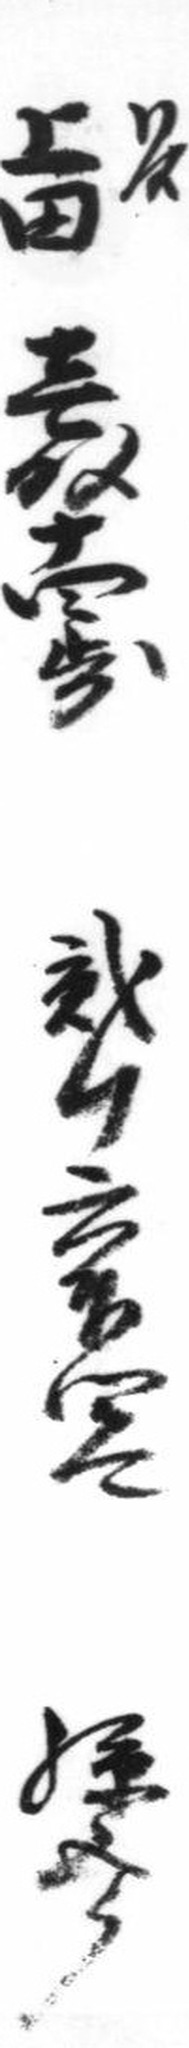上田壱畝十四歩弐斗六升四合孫五郎
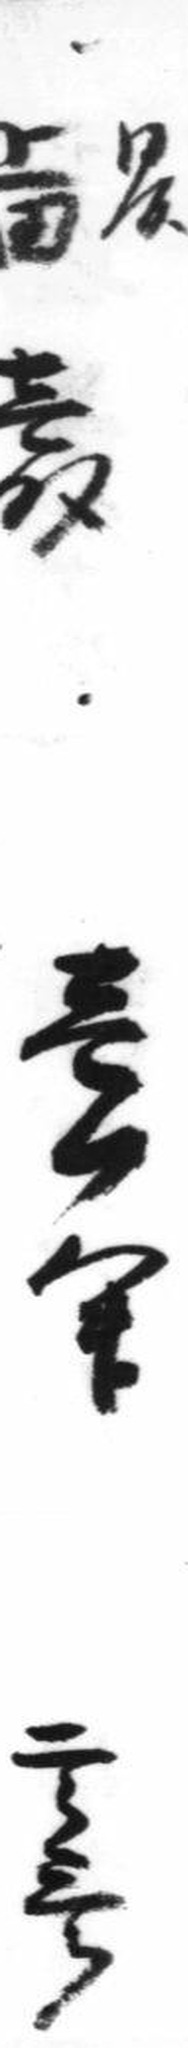上田壱畝壱斗八升二郎三郎
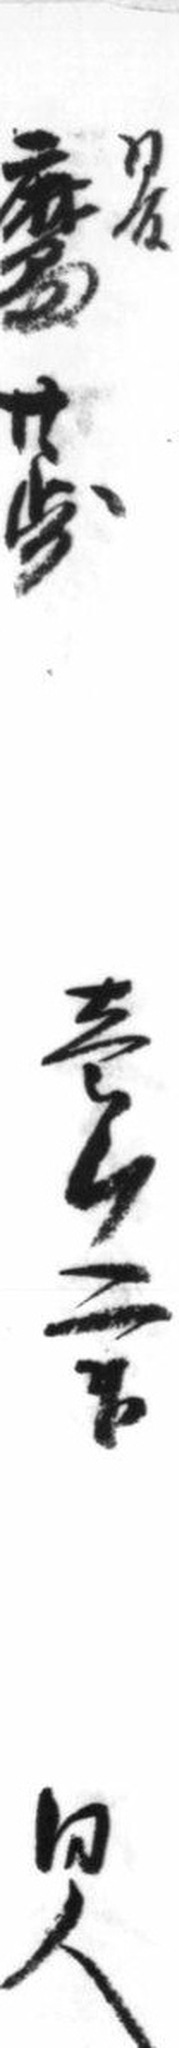上田廿歩壱斗二升同人
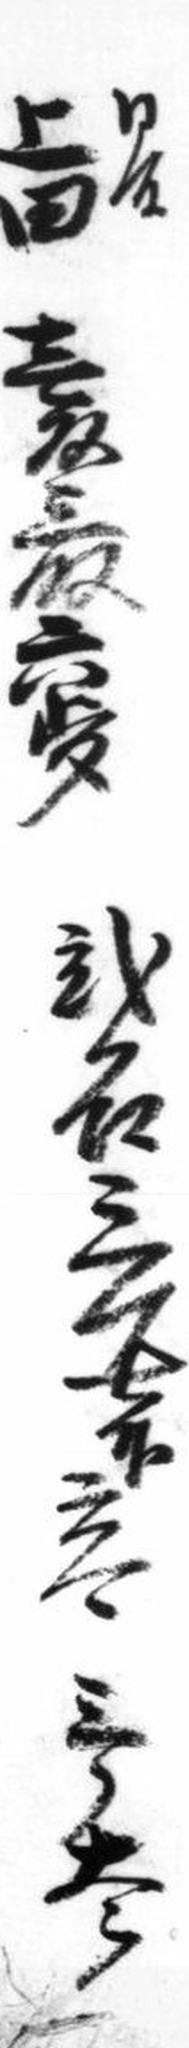上田壱反三畝六歩弐石三斗七升六合三郎太郎

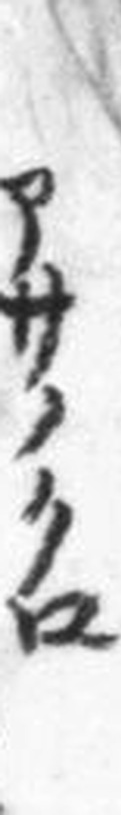アサノクロ
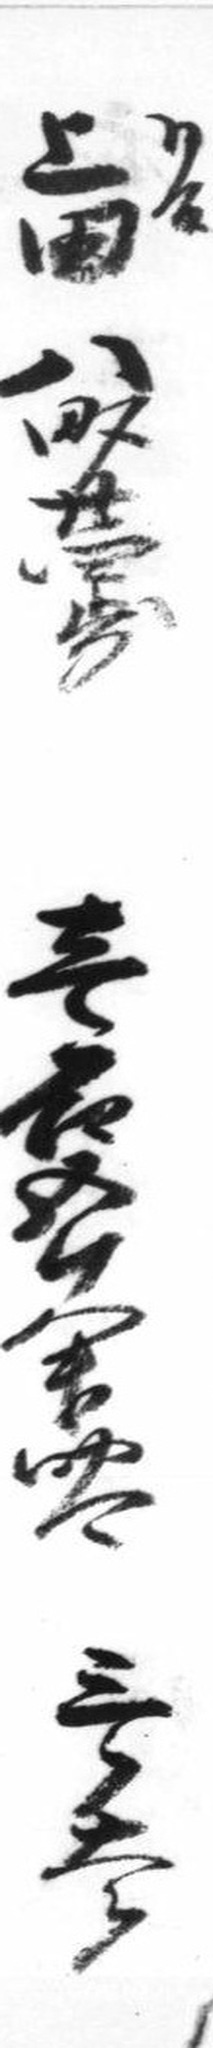上田八畝廿四歩壱石五斗八升四合三郎太郎
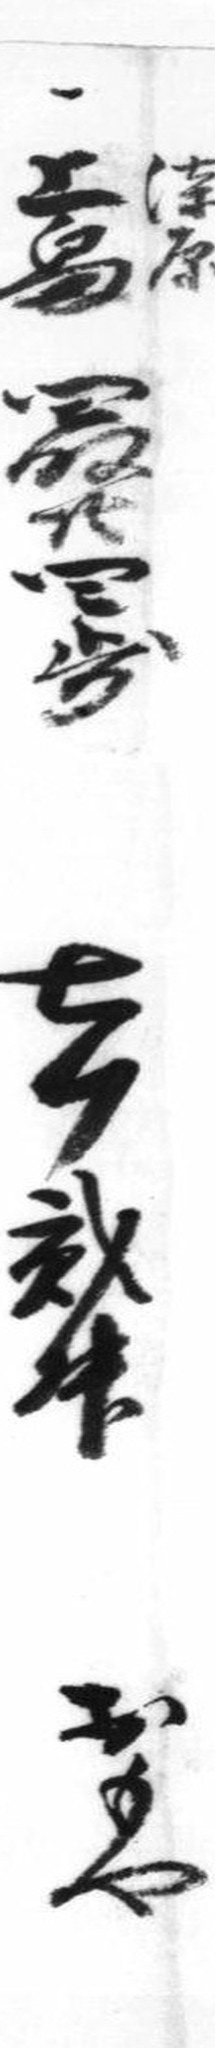上畠四畝廿四歩七斗弐升出メや
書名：越前国大野郡今井村御検地帳
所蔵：福井県文書館 Fukui Prefectural Archives
